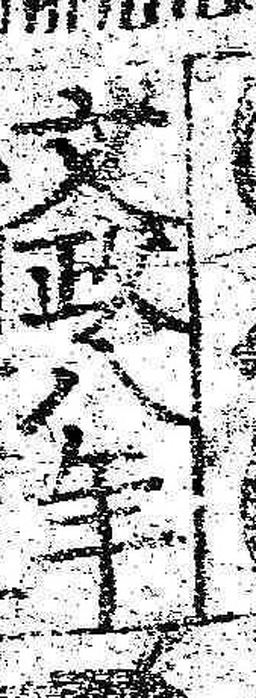文政八年
